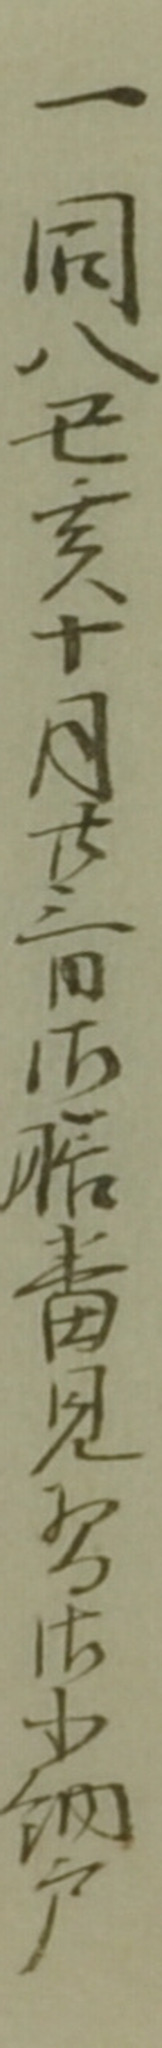一同八己亥十月廿三日御膳番見習御小納戸
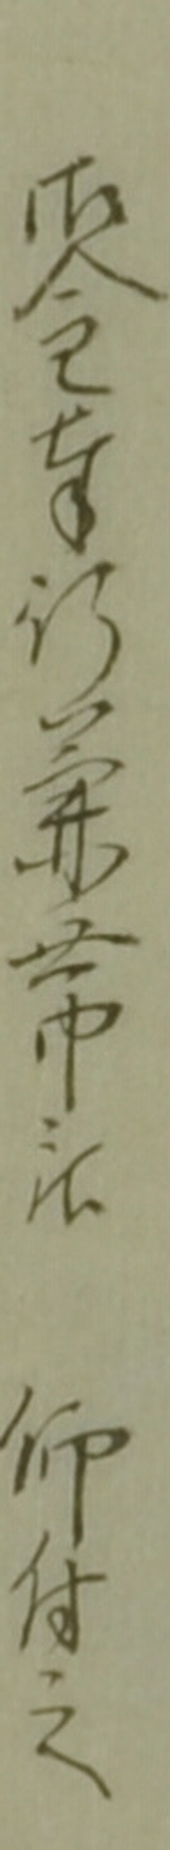御金奉行兼帯被仰付之
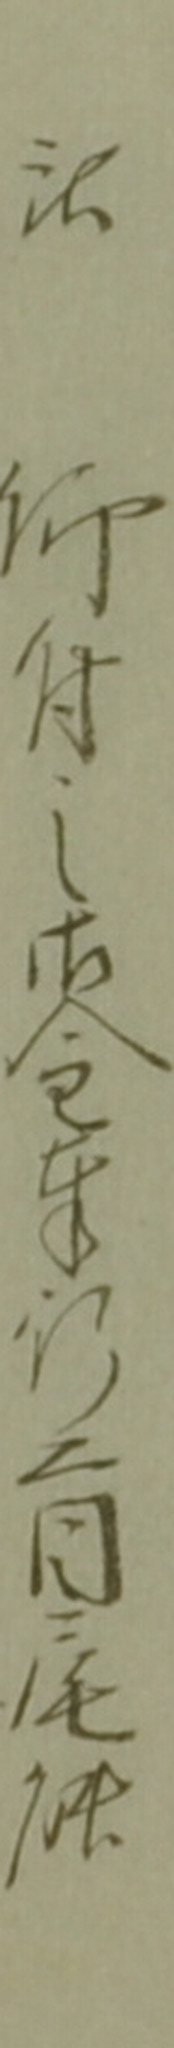被仰付之御金奉行首尾能
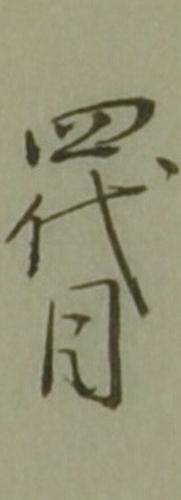四代目
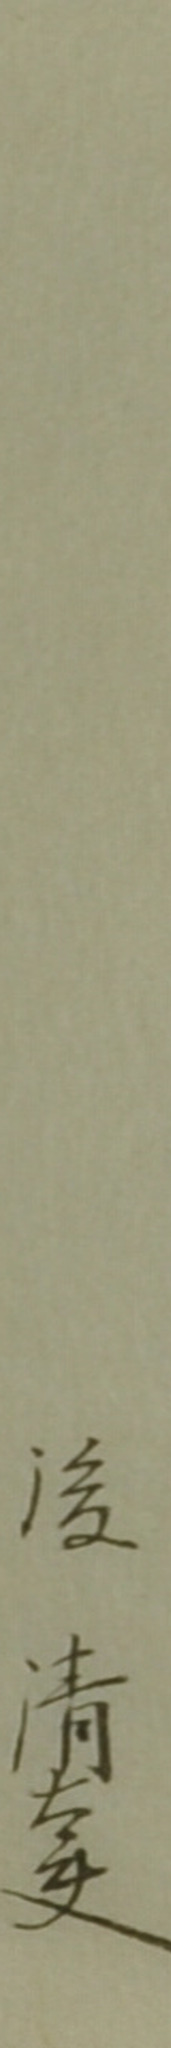後清太夫
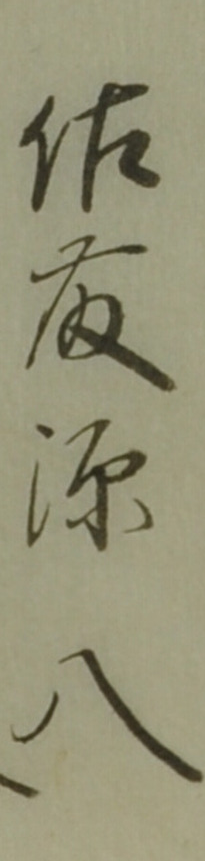佐藤源八
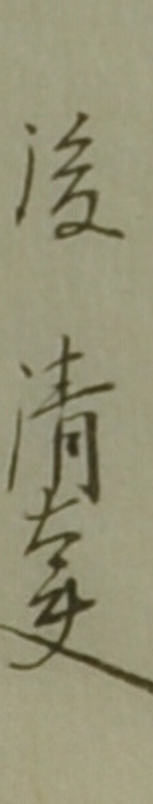後清太夫
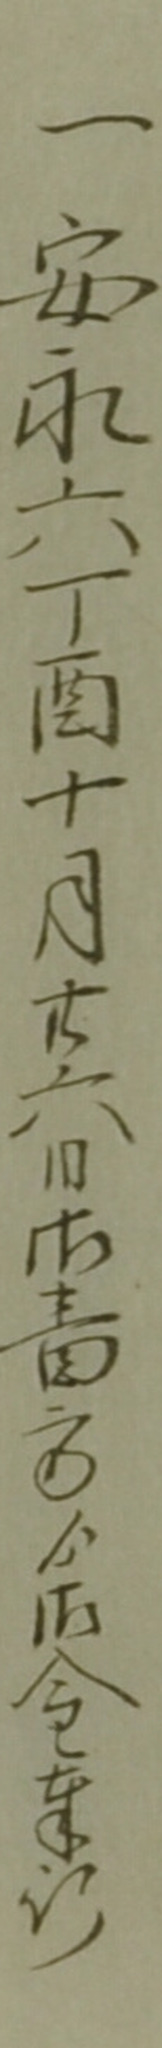一安永六丁酉十月廿六日御番方ゟ御金奉行
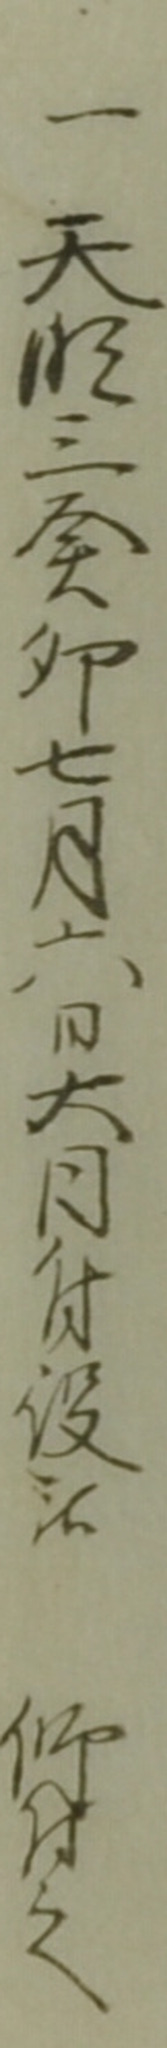一天明三癸卯七月六日大目付役被仰付之
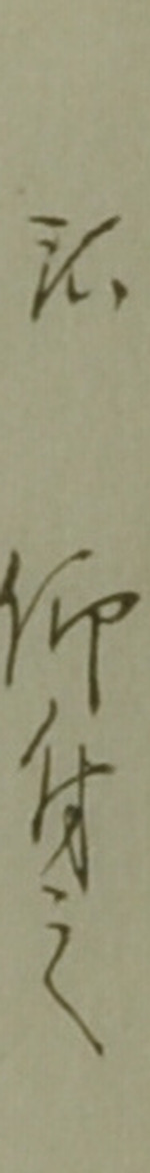被仰付之

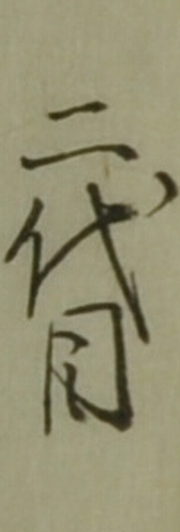二代目
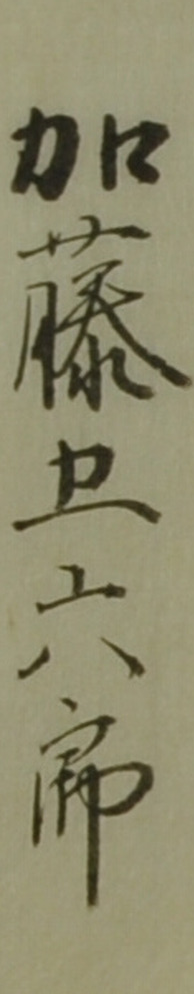加藤五六郎
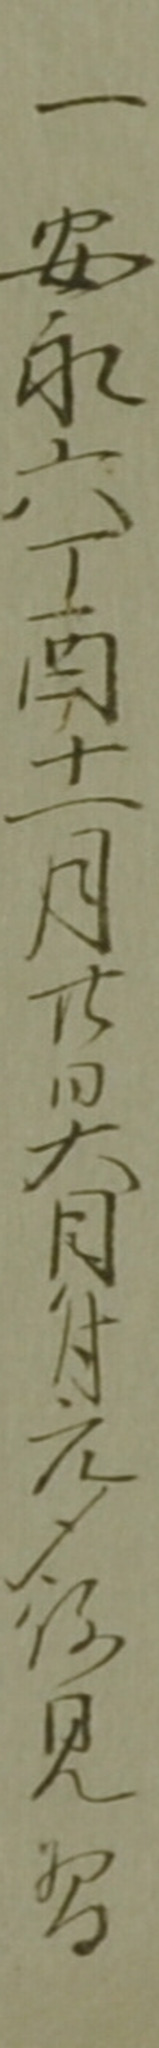一安永六丁酉十一月廿日大目付元〆役見習
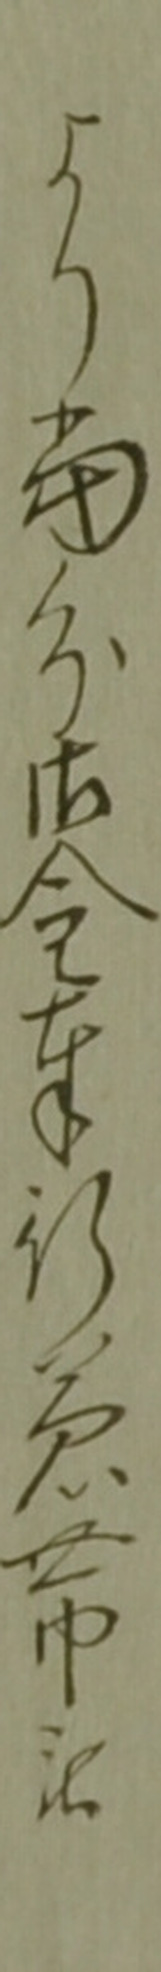より当分御金奉行兼帯被
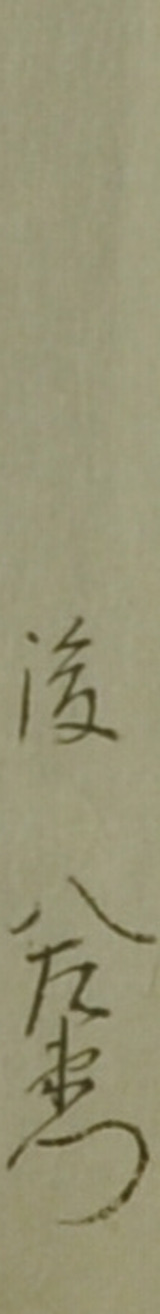後八左衛門
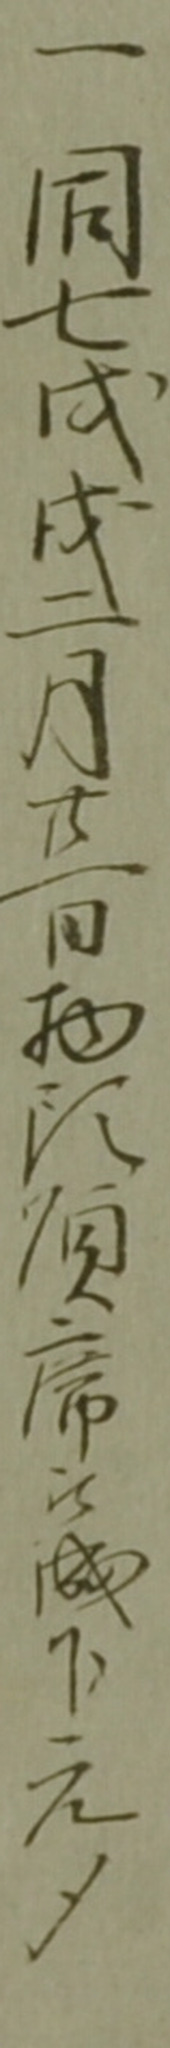一同七戊戌二月廿一日物頭順席被成下元〆
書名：諸御役代々録（七）
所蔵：伊那市立高遠町図書館・合同会社AMANE
